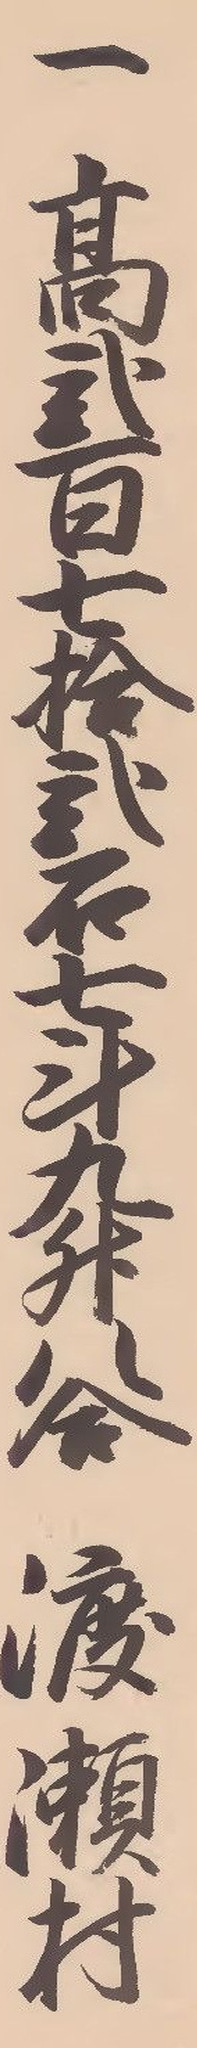一高弐百七拾弐石七斗九升八合渡瀬村
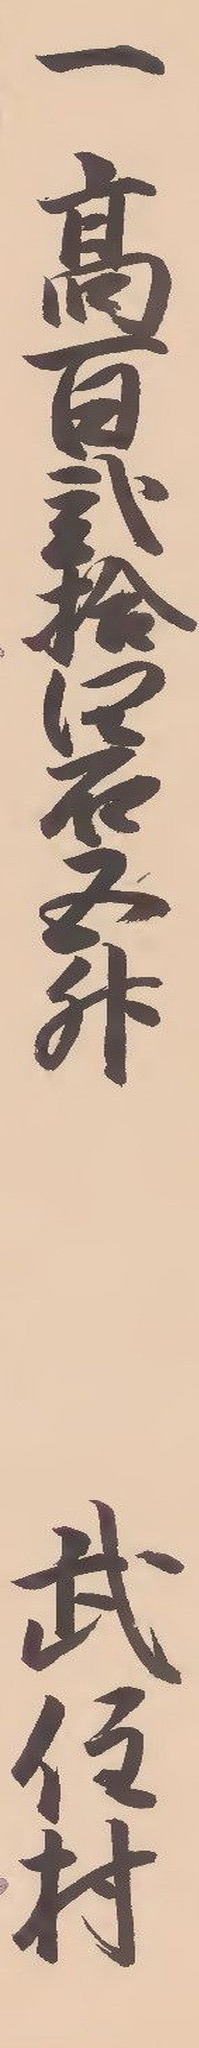一高百弐拾四石五升武住村
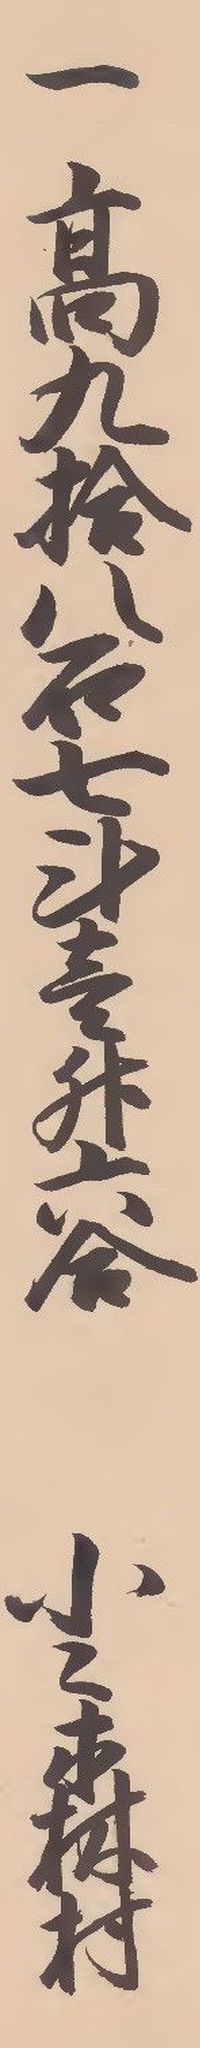一高九拾八石七斗壱升六合小々森村
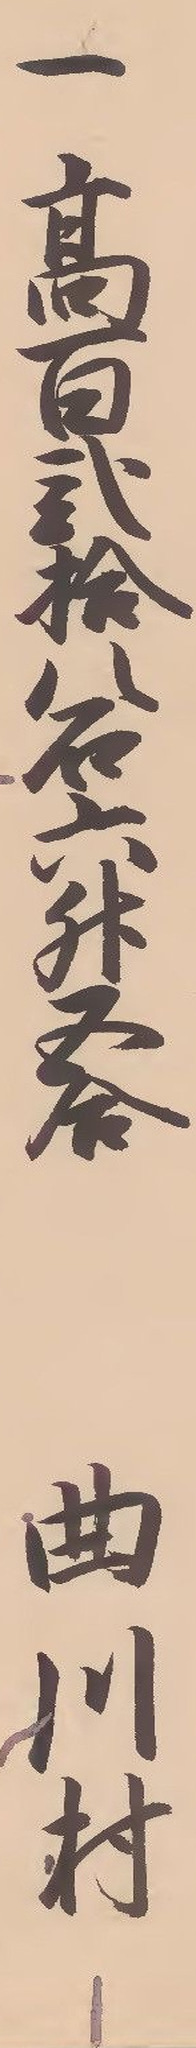一高百弐拾八石六升五合曲川村

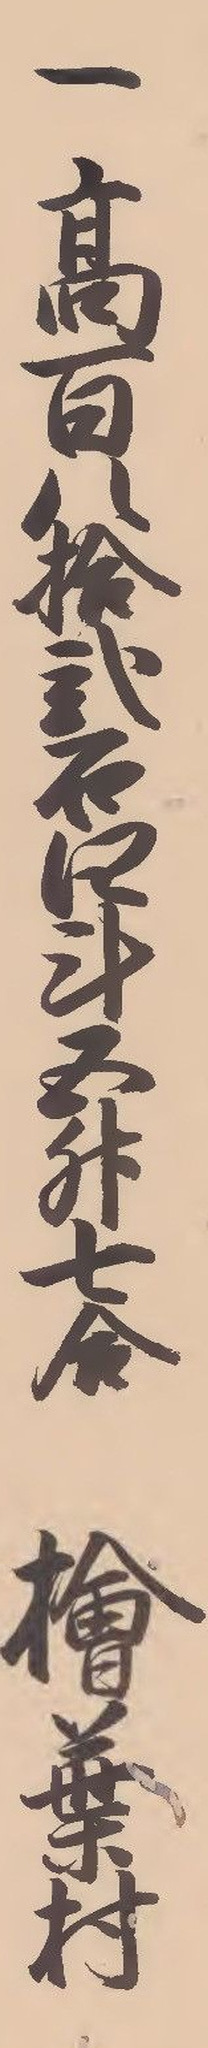一高百八拾弐石四斗五升七合桧葉村
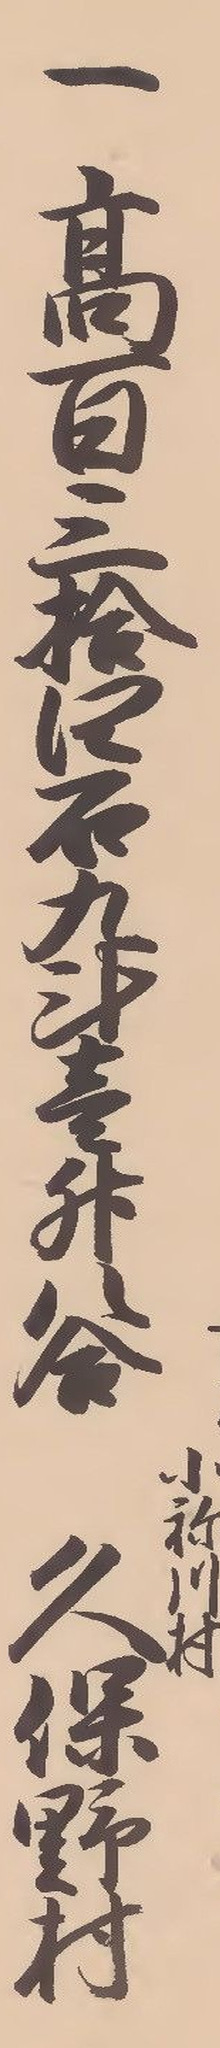一高百九拾四石五斗三升八合伏拝村
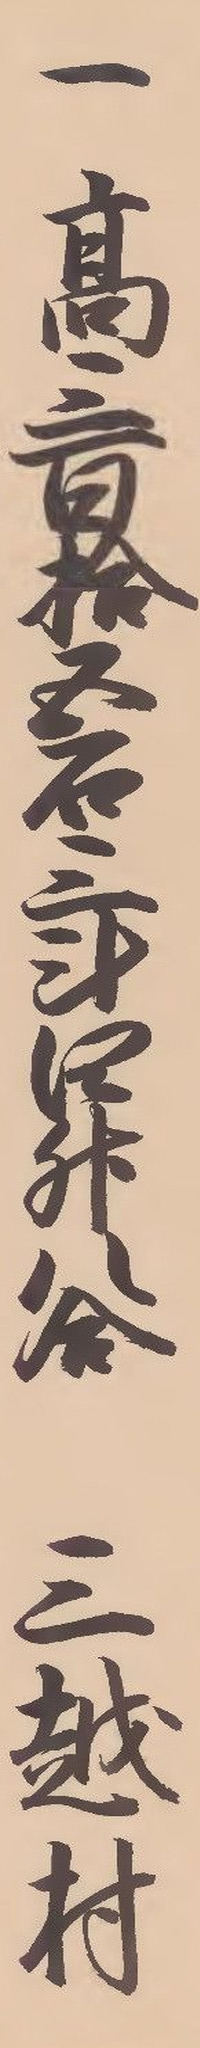一高三百拾五石三斗四升八合三越村
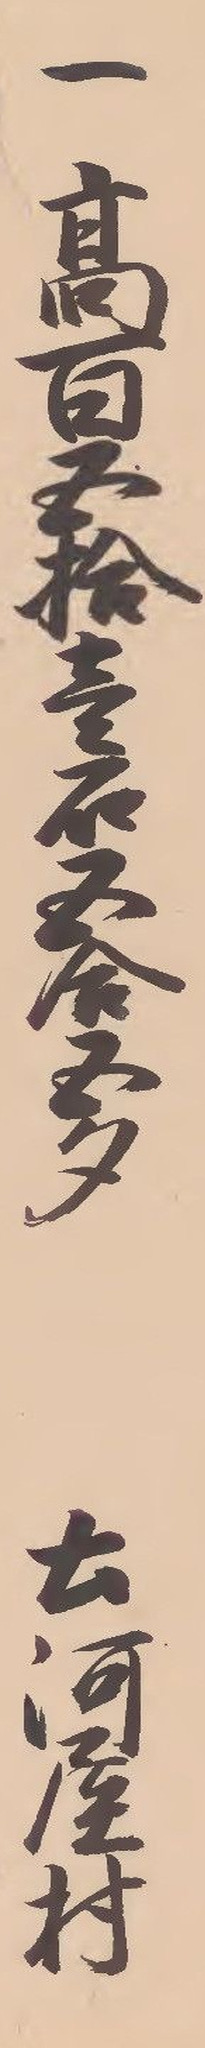一高百五拾壱石五合五勺土河屋村
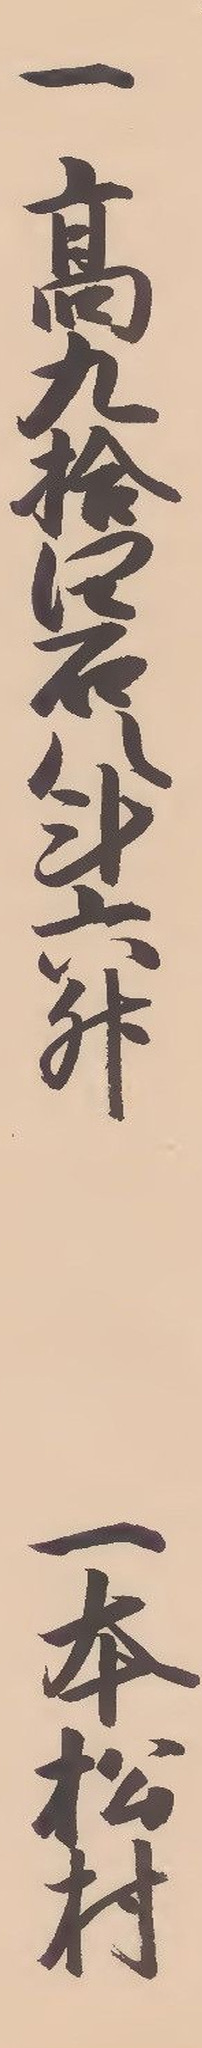一高九拾四石八斗六升一本松村
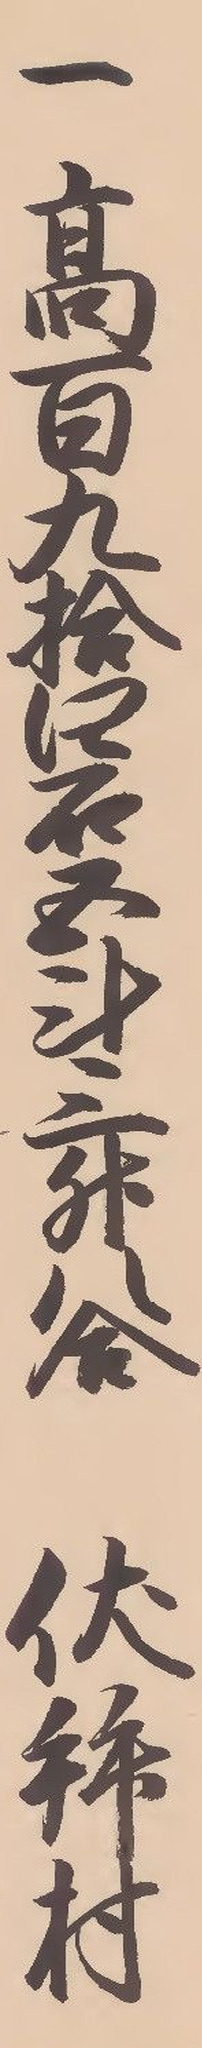一高百九拾四石五斗三升八合伏拝村

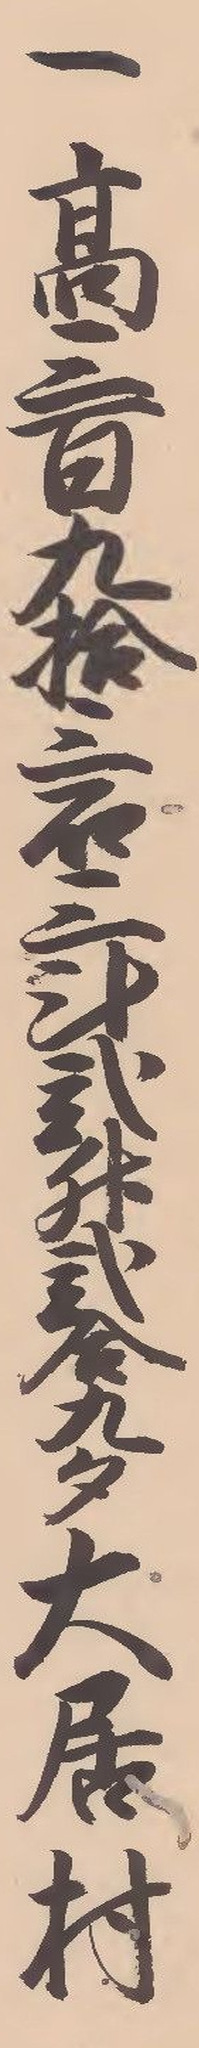一高三百九拾三石三斗弐升弐合九勺大居村
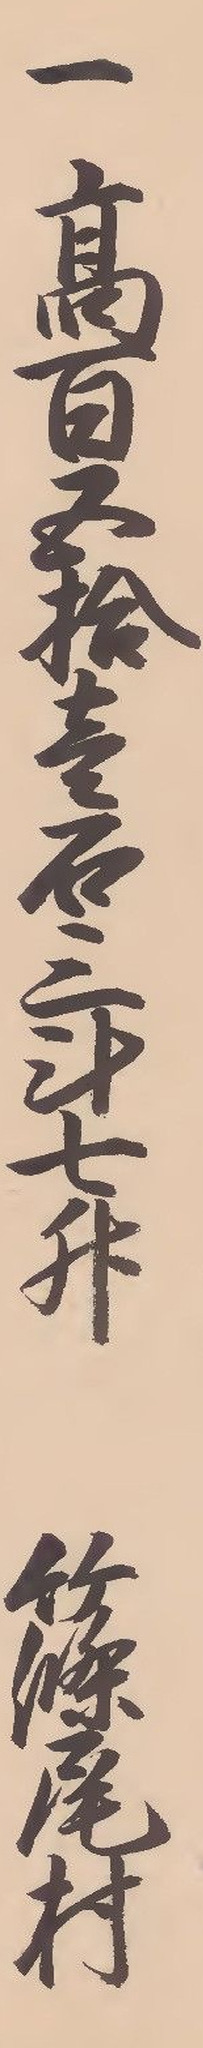一高百五拾壱石三斗七升篠尾村
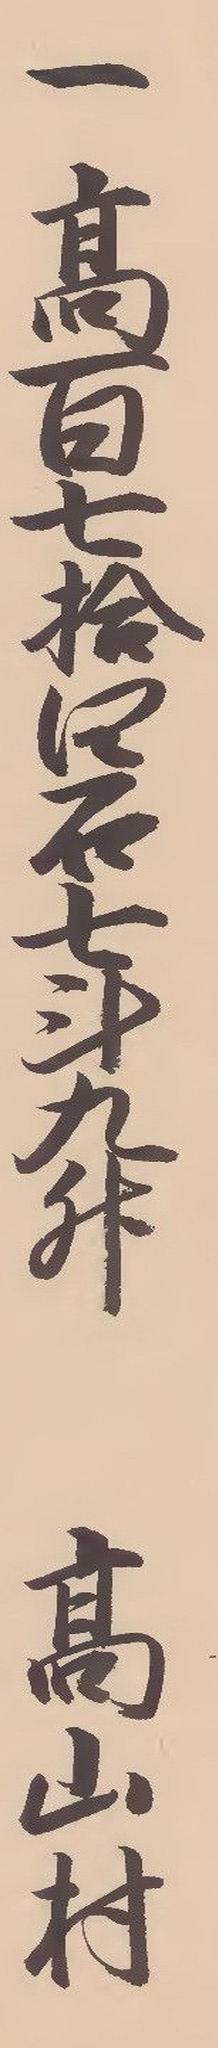一高百七拾四石七斗九升高山村
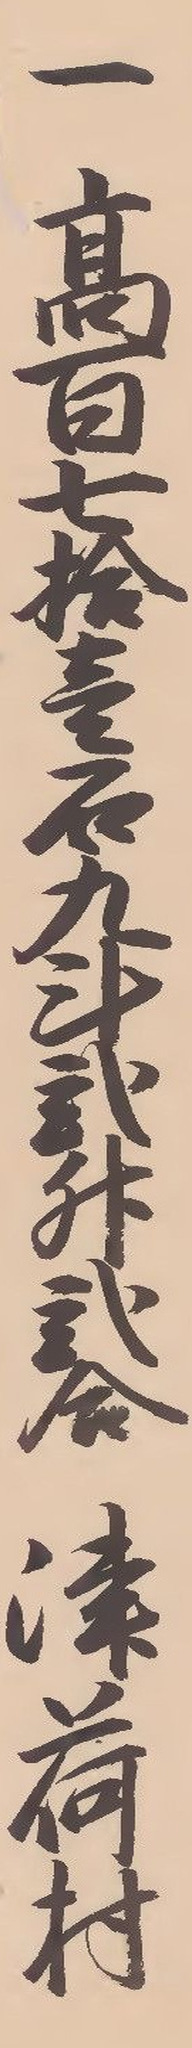一高百七拾壱石九斗弐升弐合津荷村
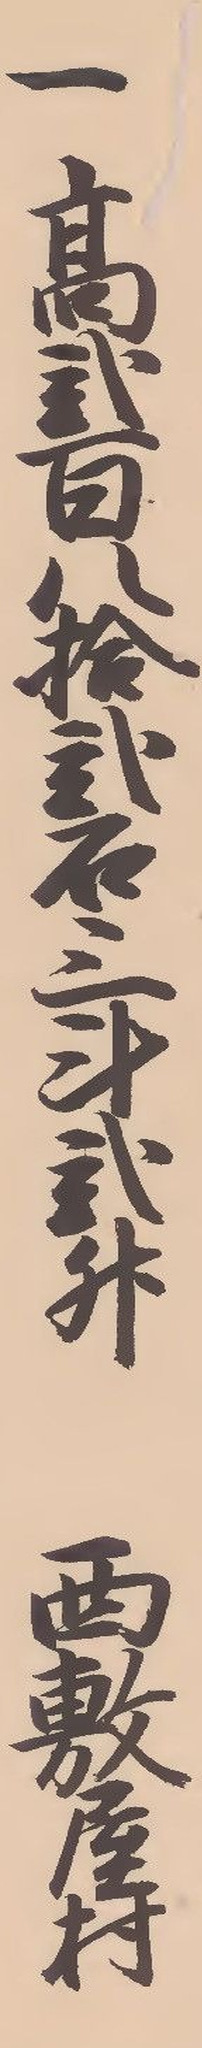一高弐百八拾弐石三斗弐升西敷屋村
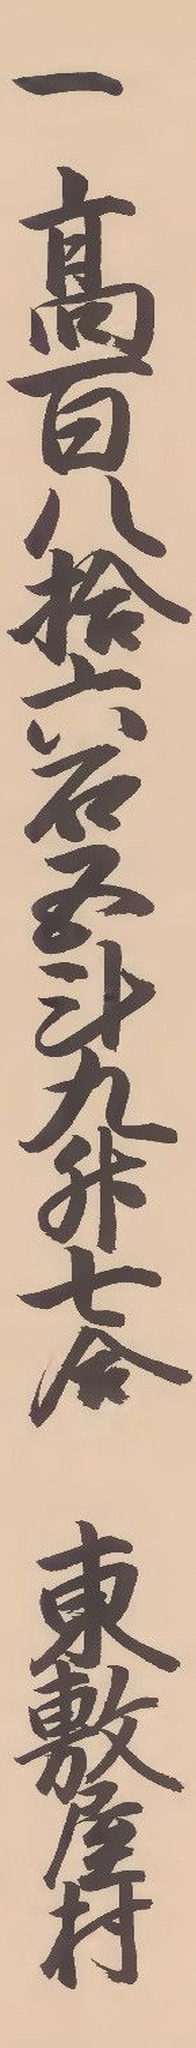一高百八拾六石五斗九升七合東敷屋村
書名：紀伊国郷帳
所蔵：国立公文書館 National Archives of Japan
